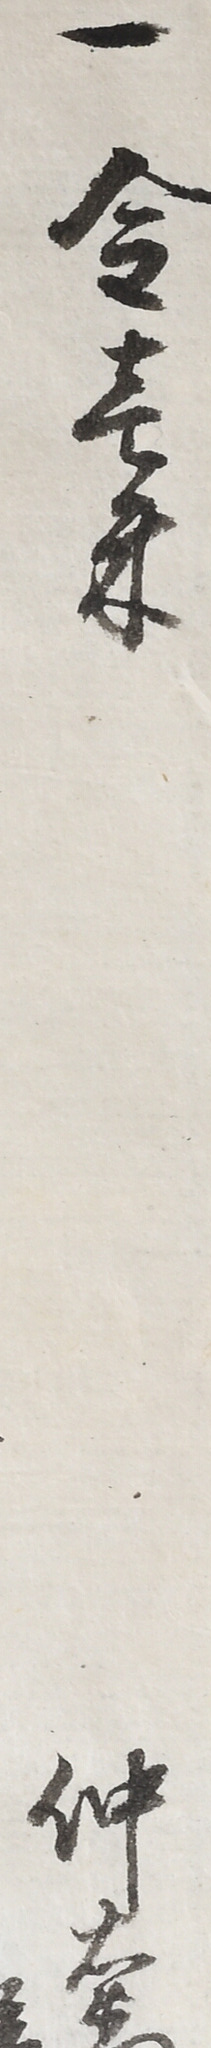一金壱朱仲右衛門
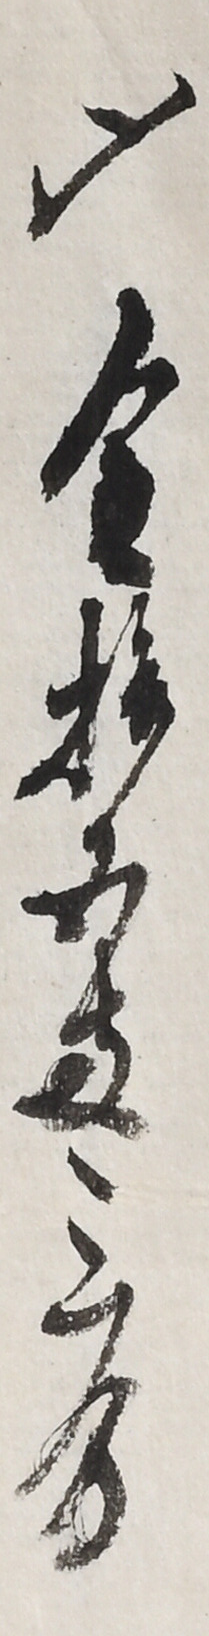〆金拾五両三分
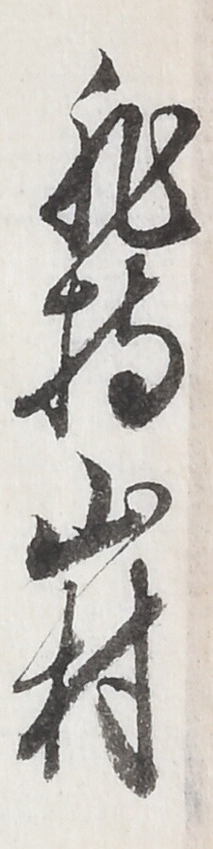非持山村
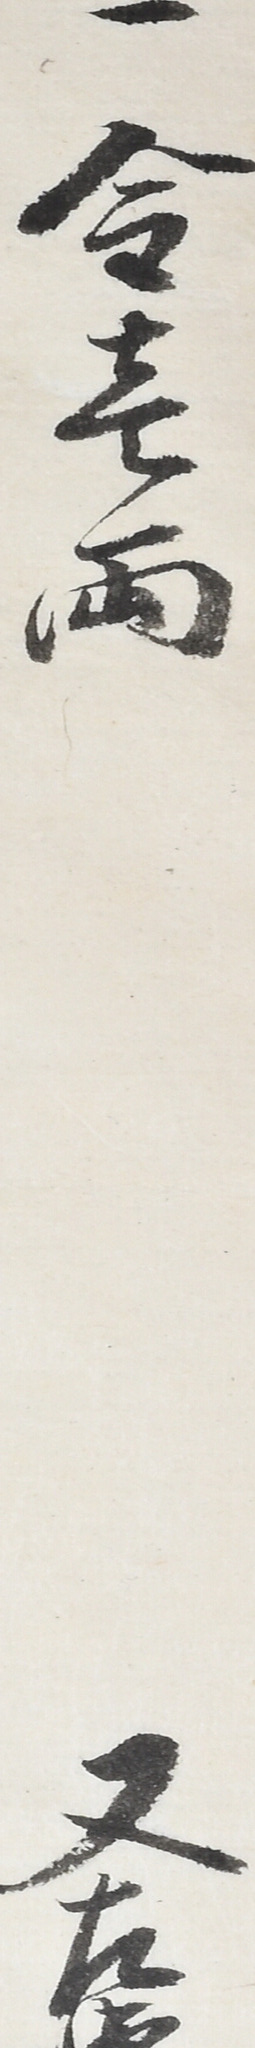一金壱両又左衛門

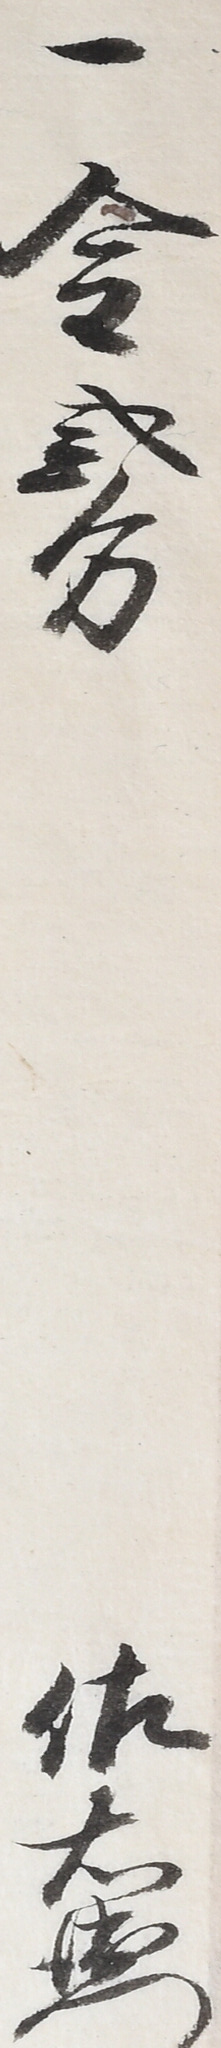一金弐分佐右衛門
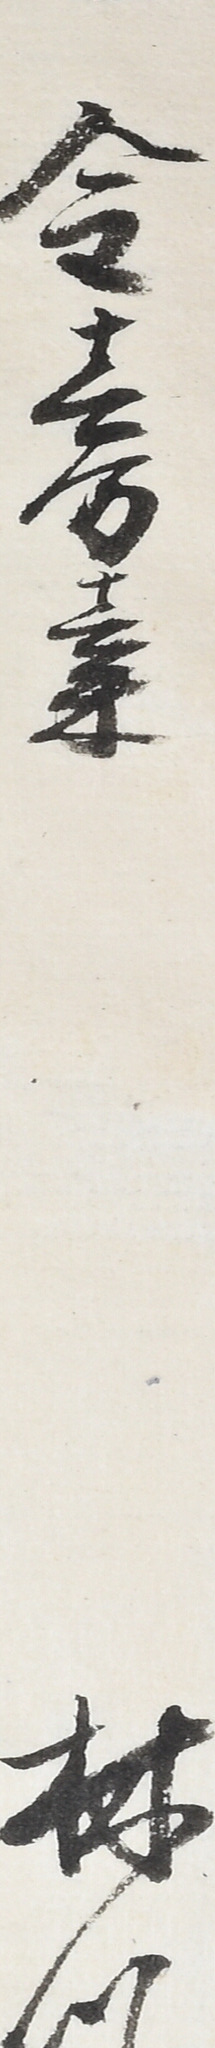一金壱分壱朱林作
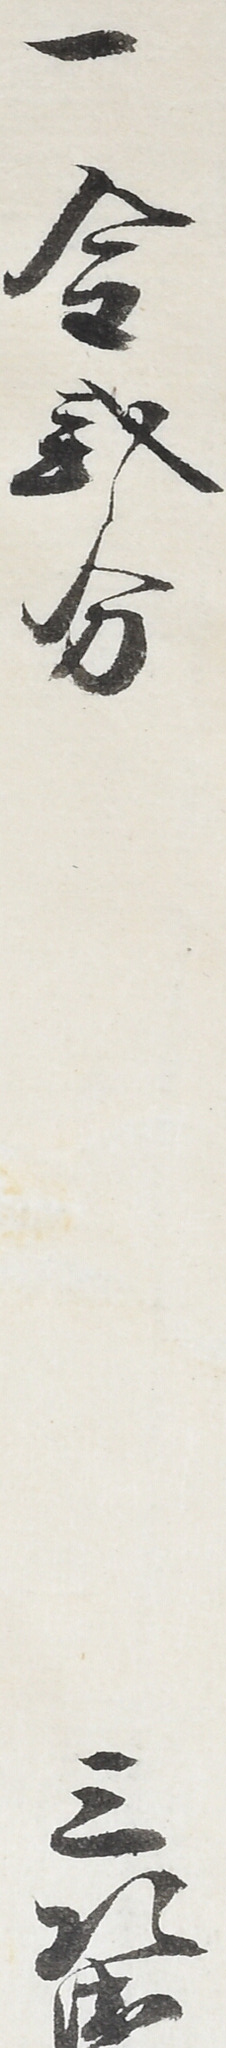一金弐分三左衛門
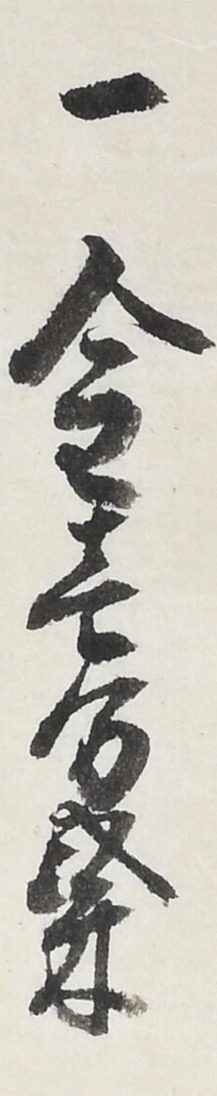一金壱分壱朱林作
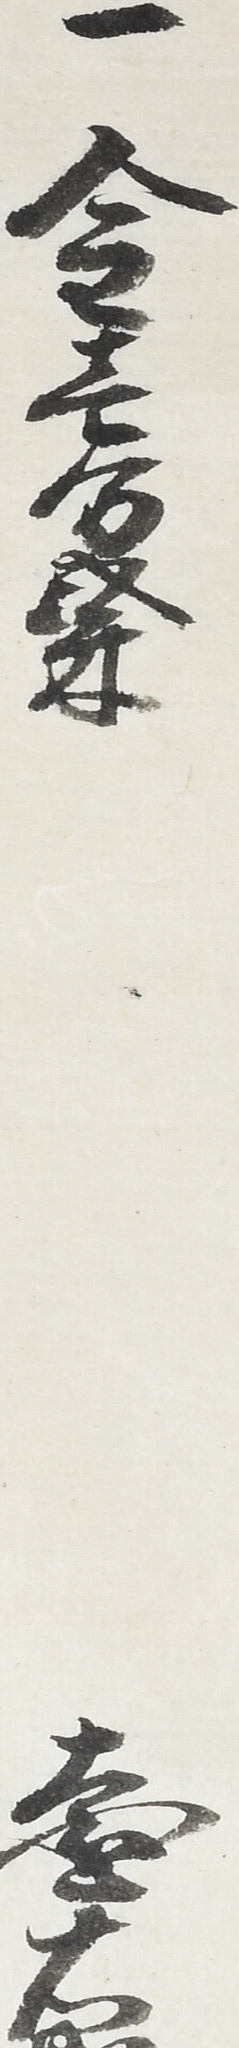一金壱分弐朱又右衛門

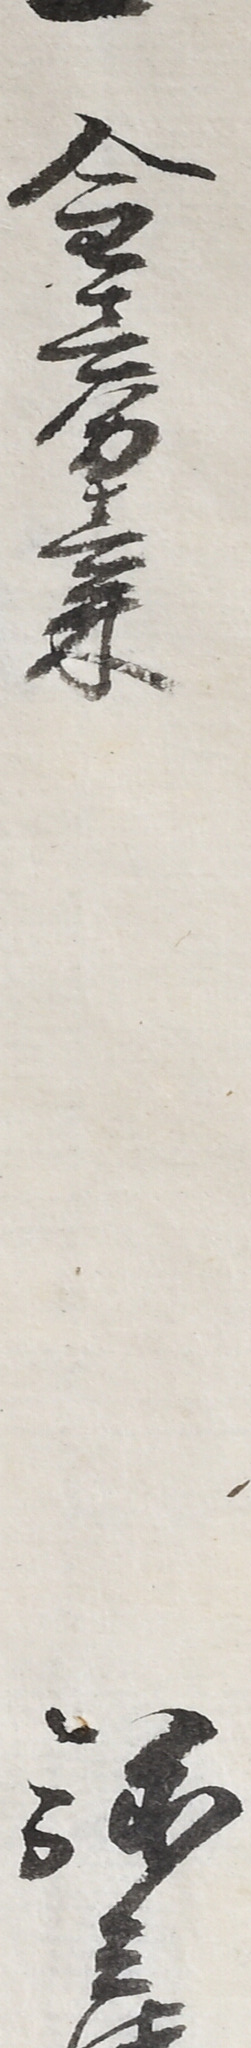一金壱分壱朱弥兵衛
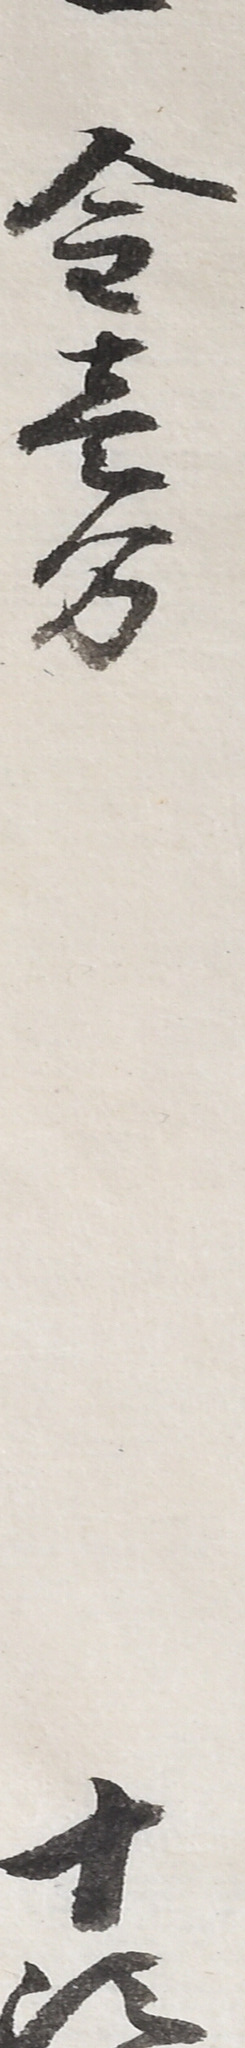一金壱分十次郎

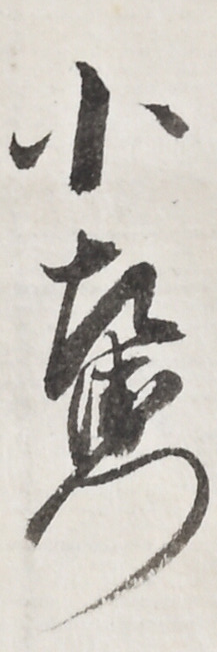伊左衛門
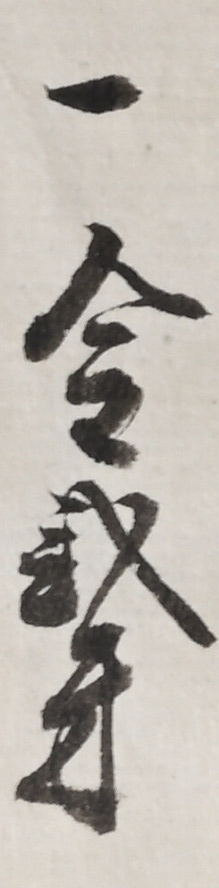一金弐朱定蔵
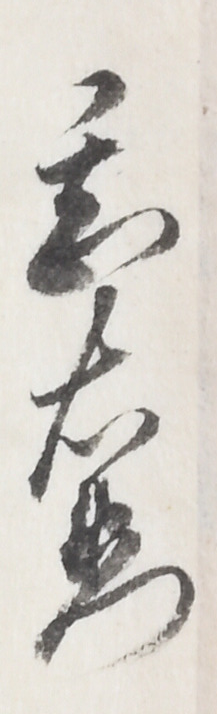藤右衛門
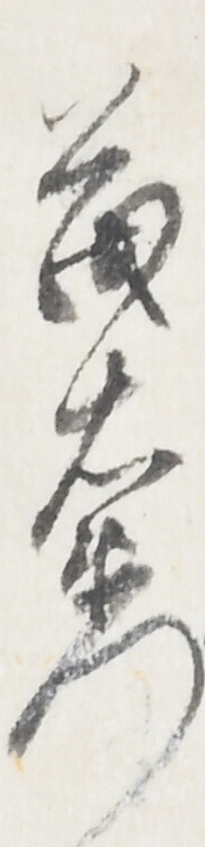藤右衛門
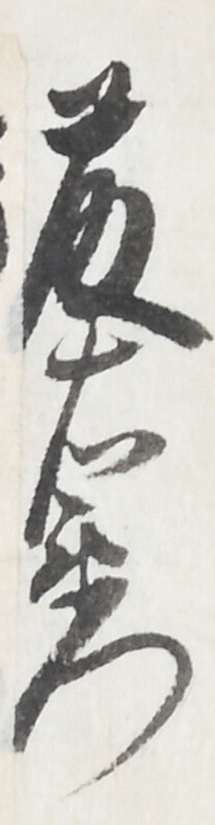藤右衛門
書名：御拝地百五拾年御祝儀献上御目録名前
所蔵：伊那市立高遠町図書館・合同会社AMANE
